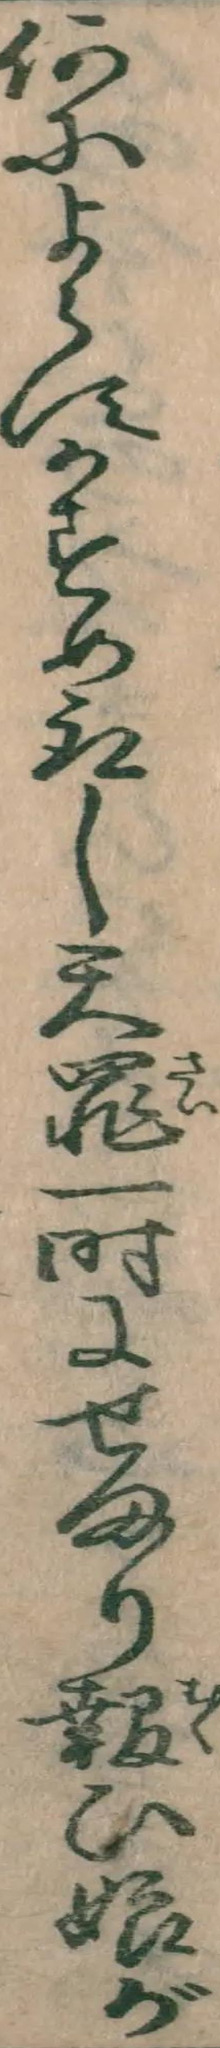何によらすかすめ取りし天罪一時にせまり報ひ娘が
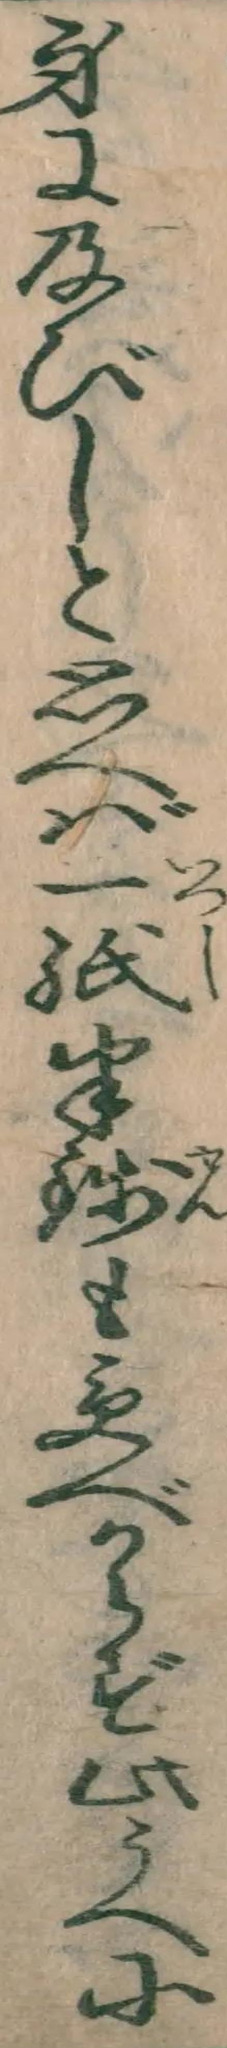身に及びしと思へば一紙半銭も受べからず此うへに
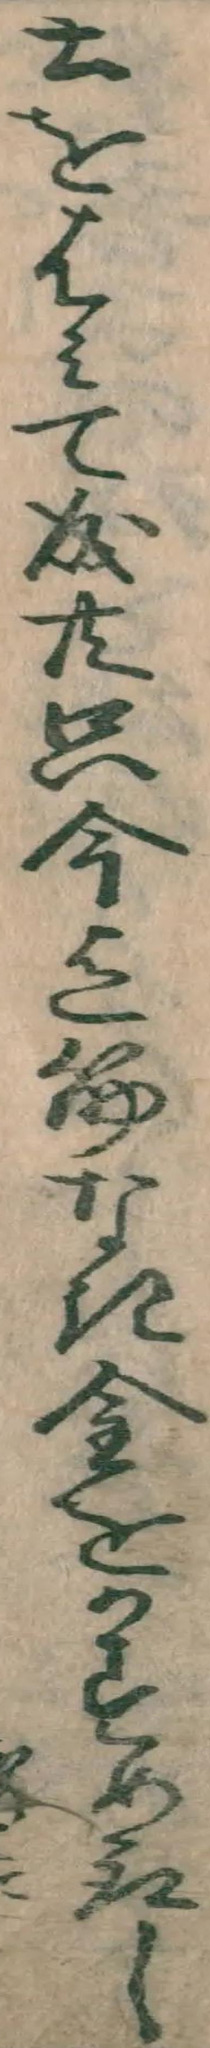土をはみて成共只今迄筋なき金をかすめ取し
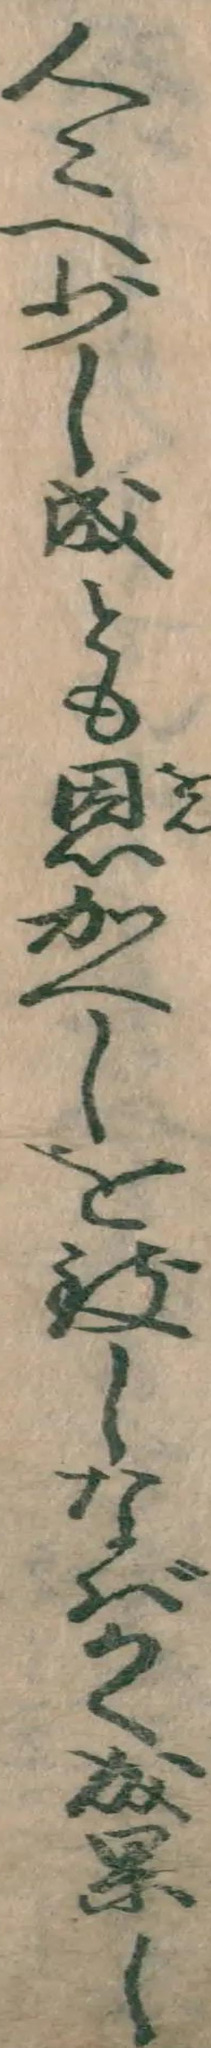人々へ少し成とも恩かへしを致しなばかく成果し
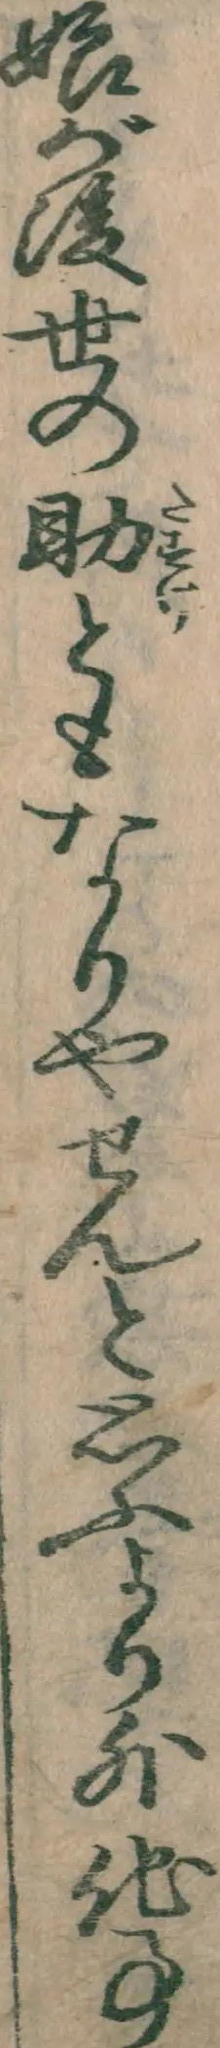娘が後世の助ともなりやせんと思ふより外他事

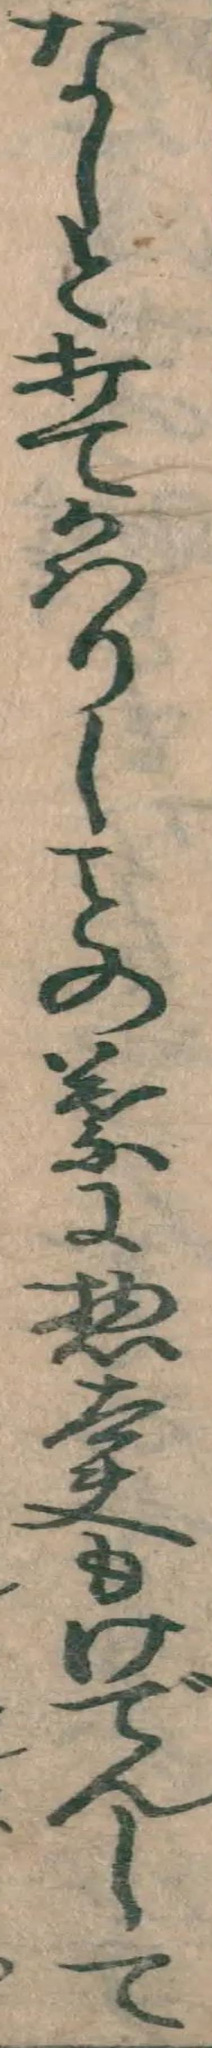なしと打てかはりしことの葉に惣太夫もけでんして
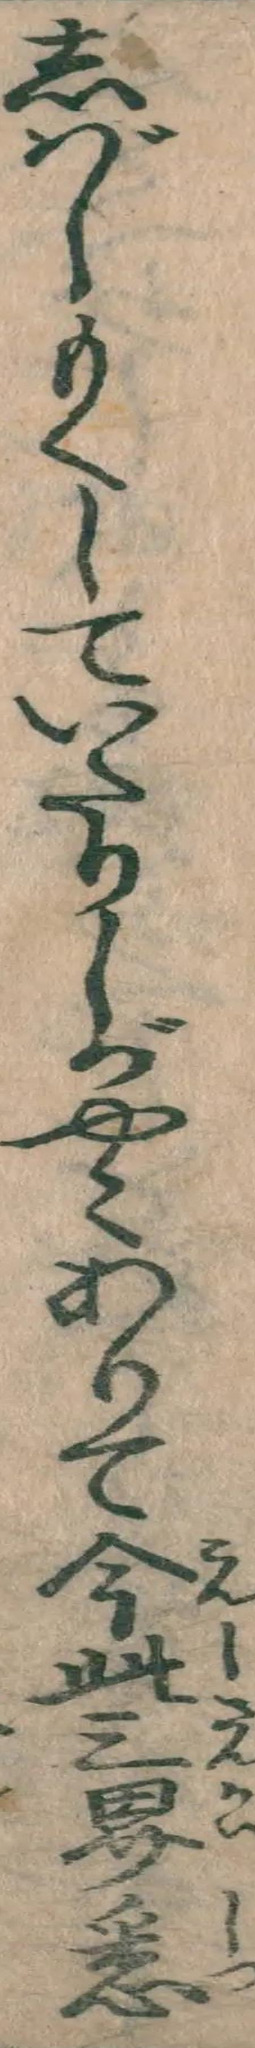しばしもくしていたりしがやゝありて今此三界悉
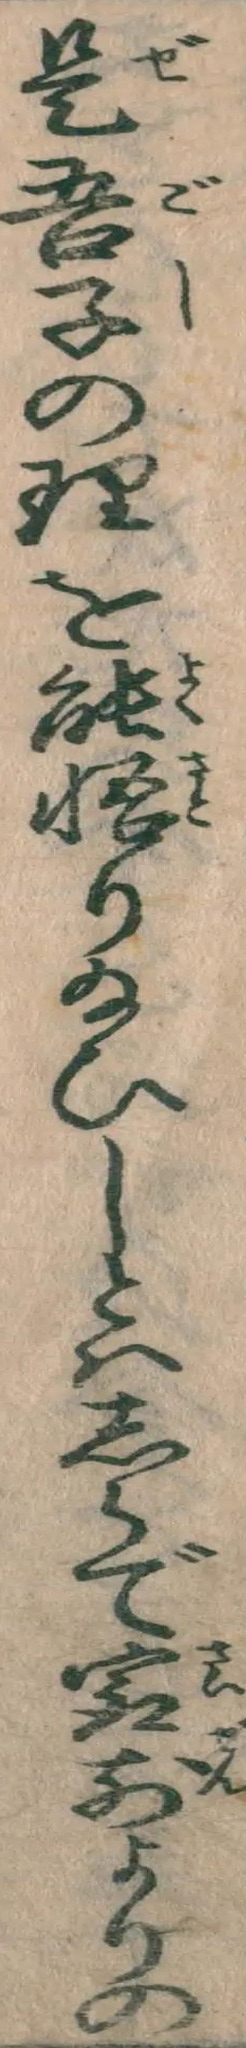是吾子の理を能悟り給ひしとはしらで最前よりの
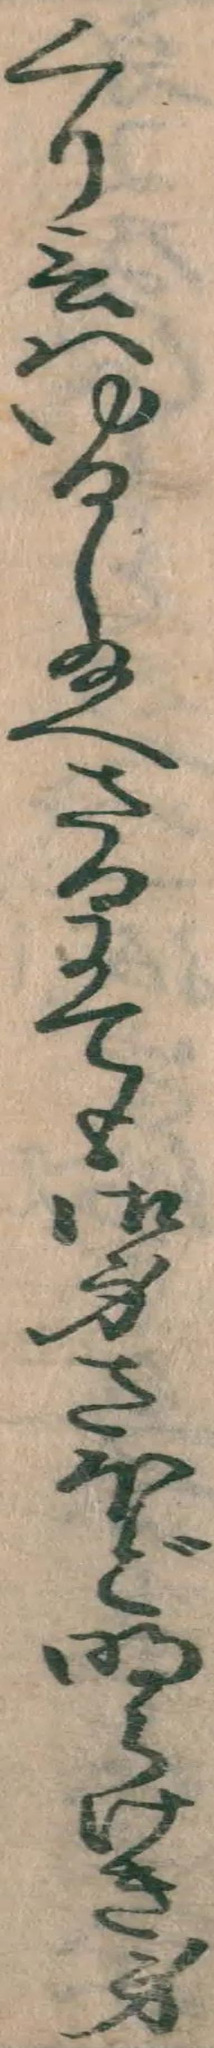くり言はゆるし給へさるにても御身さほど明らけき身
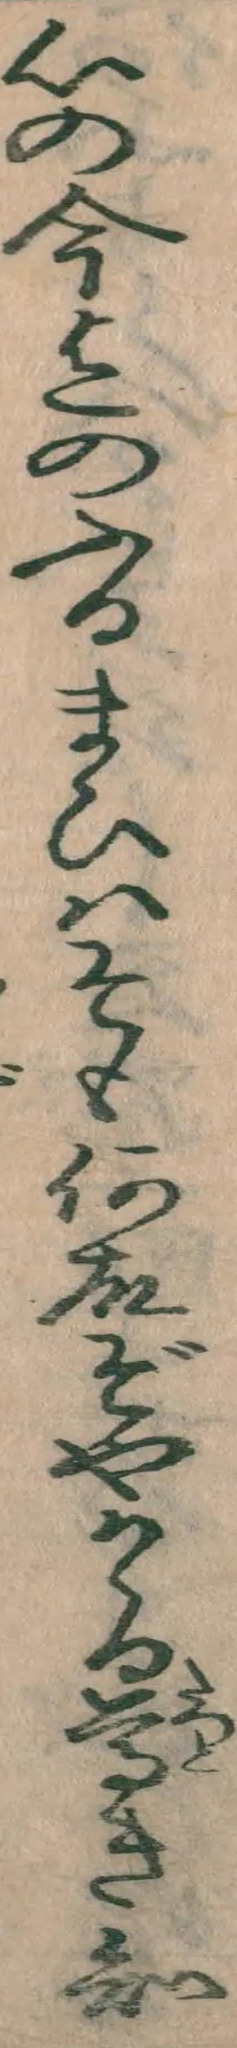心の今迄のふるまひはそも何故ぞやかゝる尊き知
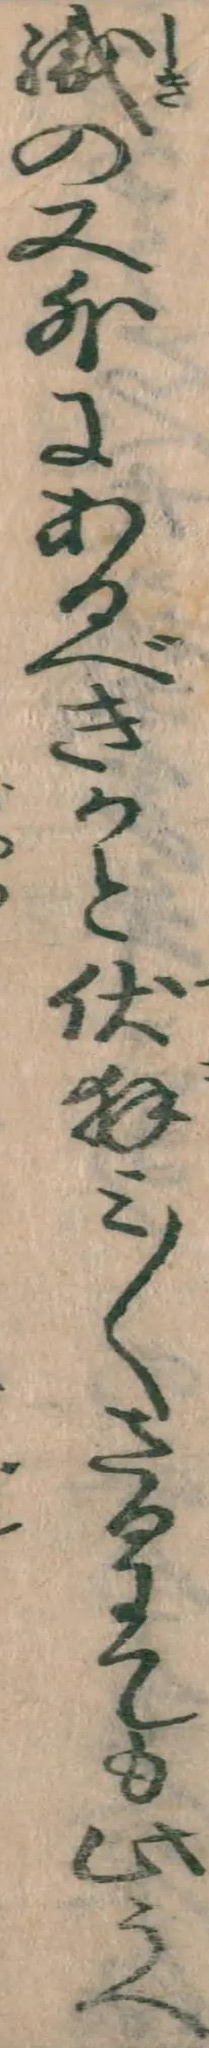識の又外にあるべきかと伏拝み〳〵さるにても此うへ
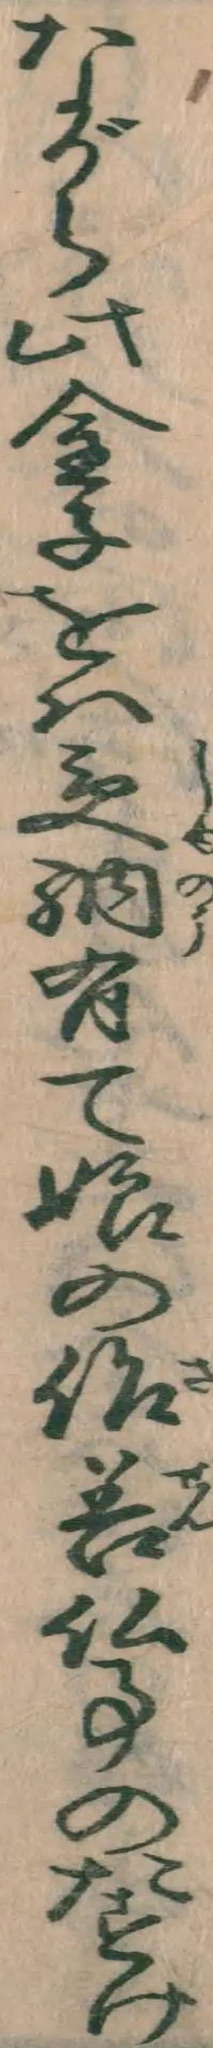ながら此金子をは受納有て娘の作善仏事のたすけ
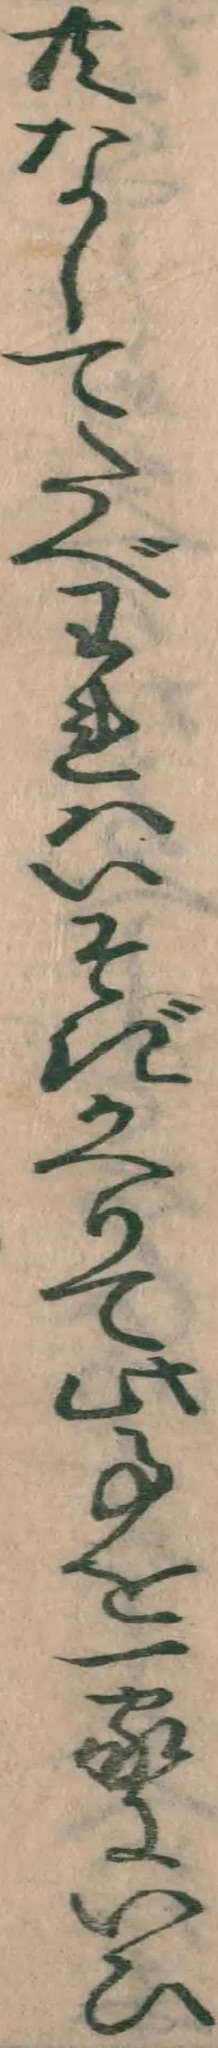共なしてたべわれはいそぎかへりて此事を一家にいひ
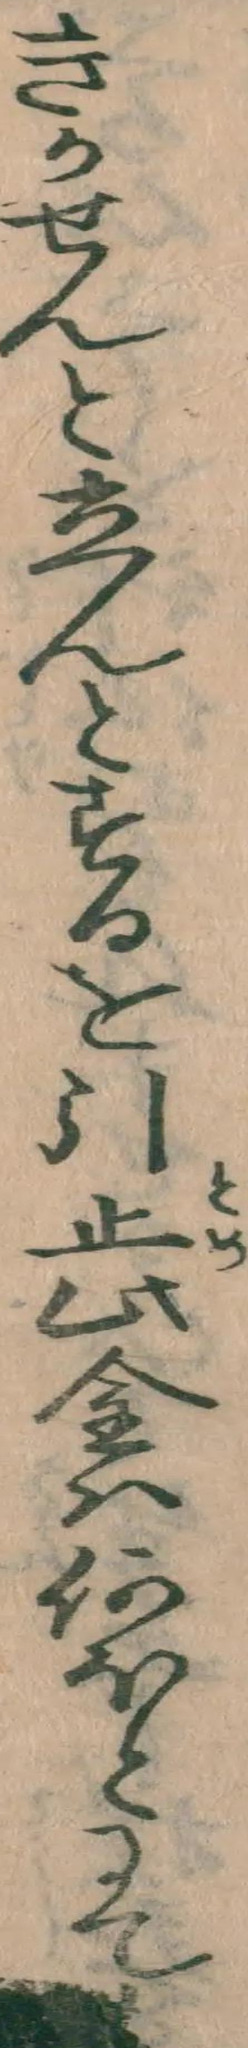きかせんと立んとするを引止此金は何ほとにても
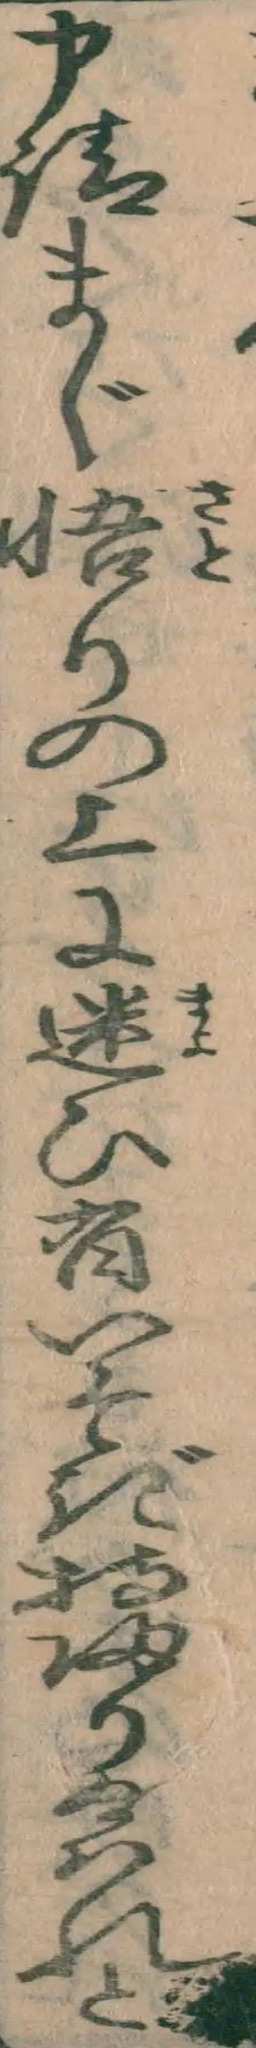申請まじ悟りの上に迷ひ有いそぎ持帰り給はれと
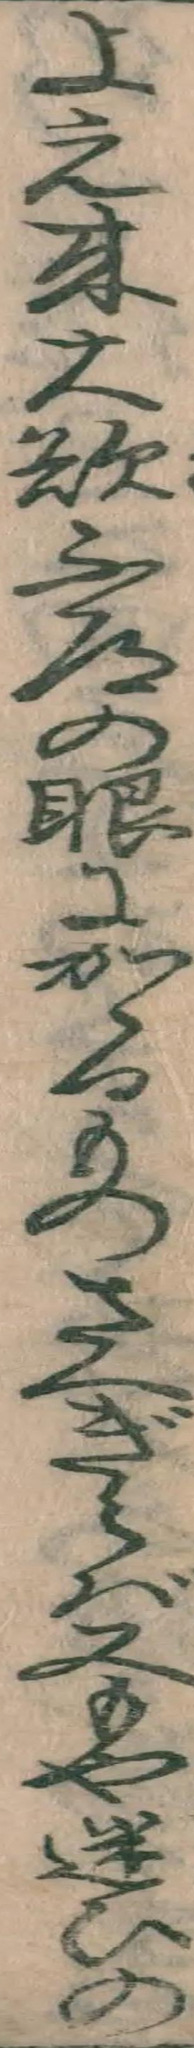よ元来大欲不動の眼にかゝるものさへぎらば又もや迷ひの
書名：怪談御伽童 5巻. [1]
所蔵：国立国会図書館 National Diet Library, JAPAN
